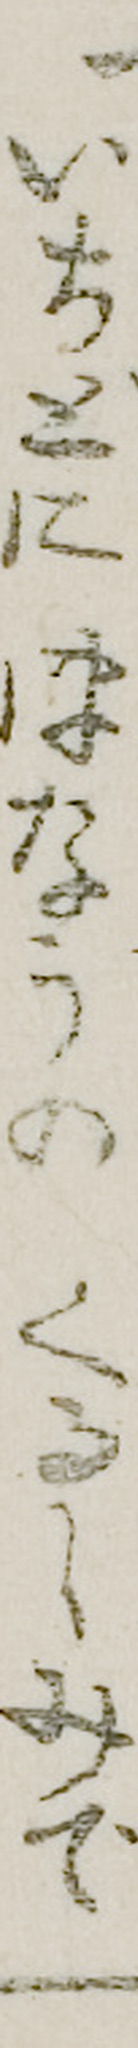いちどにはなうのくるしみで
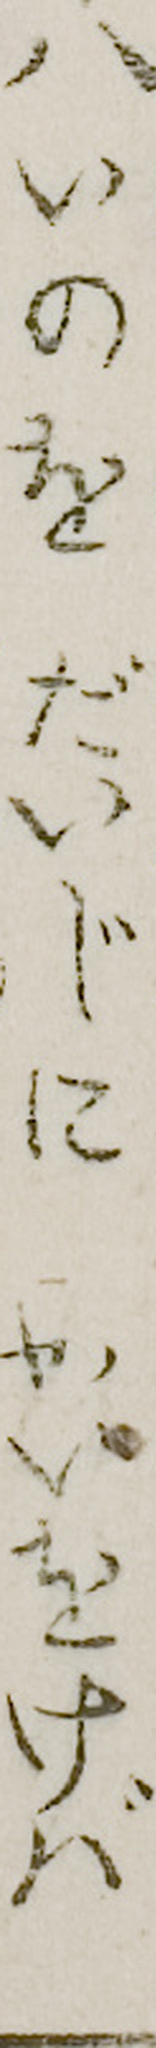十八いのをだいじにかいをかバ
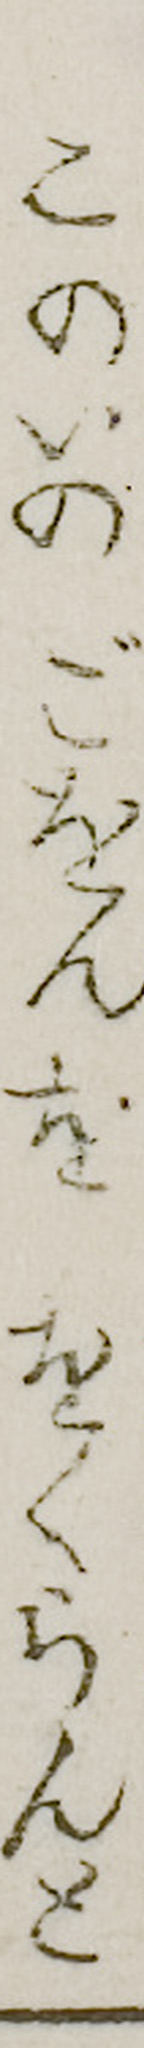このいのごをんををくらんと
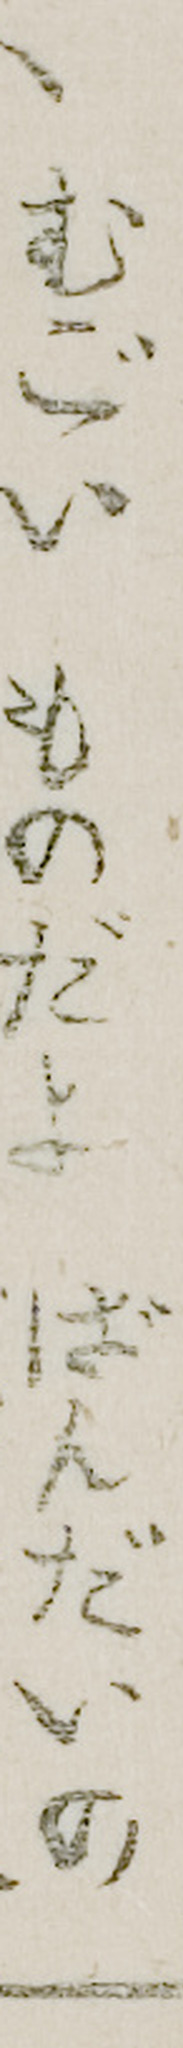むごいものだよばんだいの
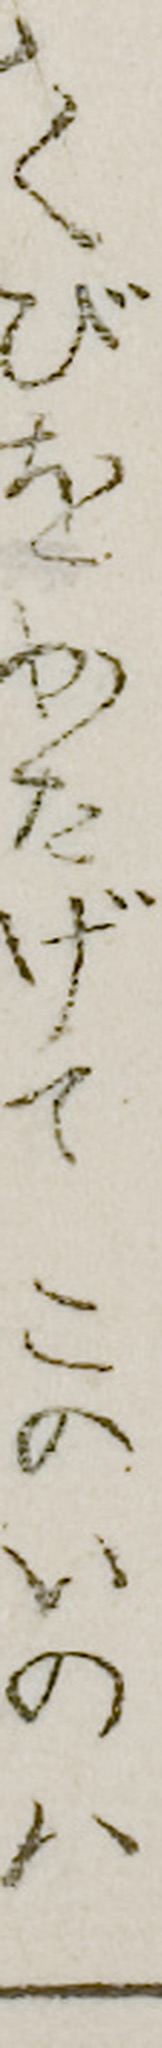くびをかたげてこのいのハ
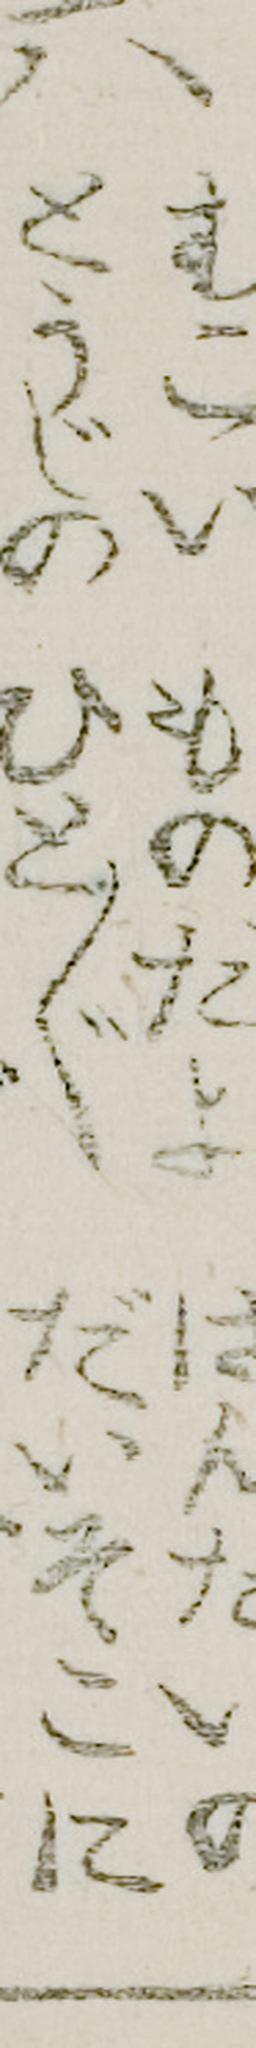六とうじのひと〴〵だいそこに
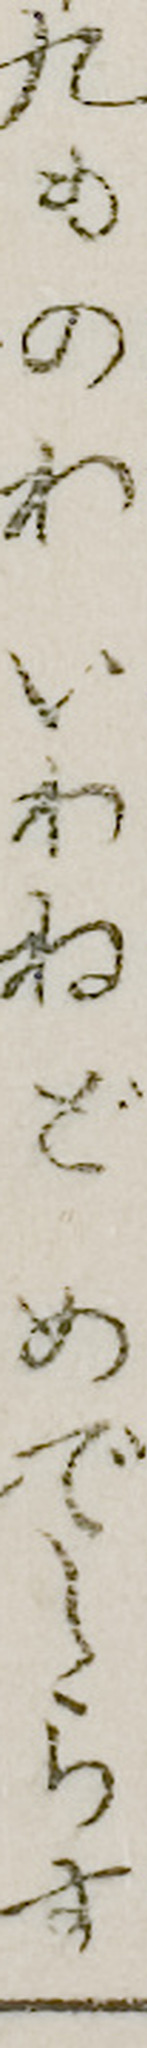十九ものわいわねどめでしらす
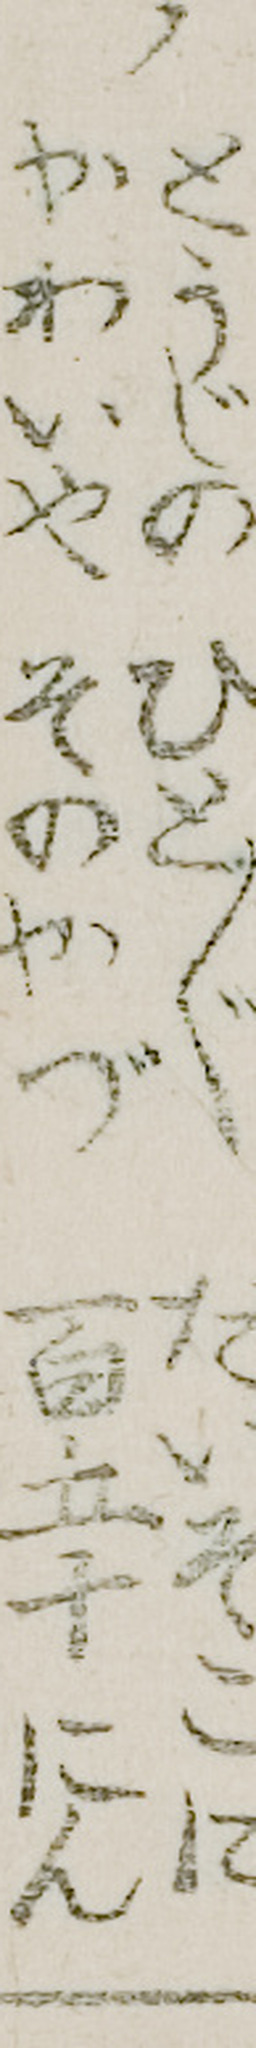かわいやそのかづ百五十にん
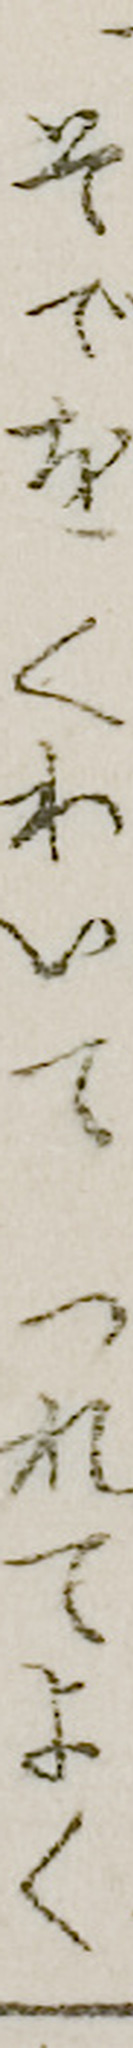そでをくわいてつれてよく
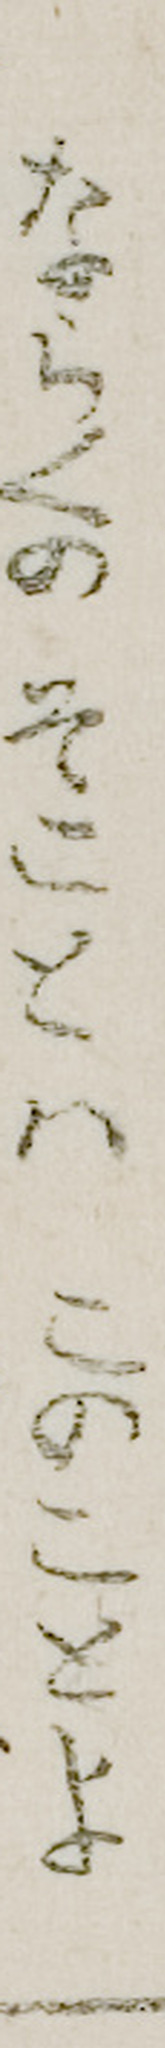ならくのそことハこのことよ
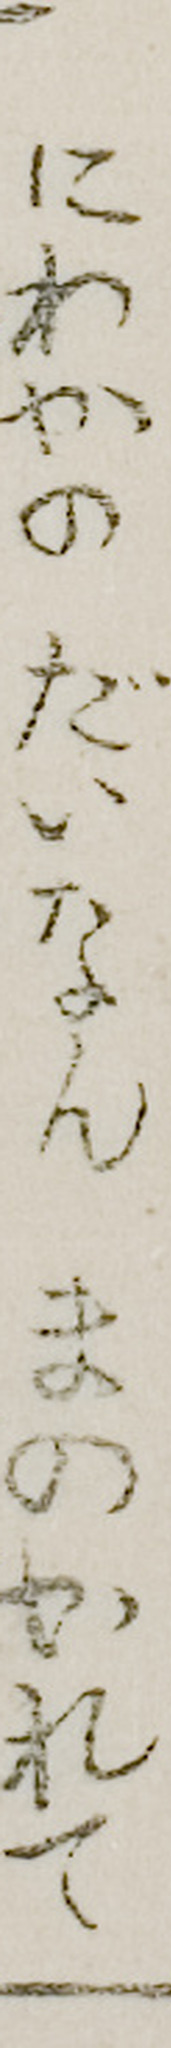にわかのだいなんまのかれて
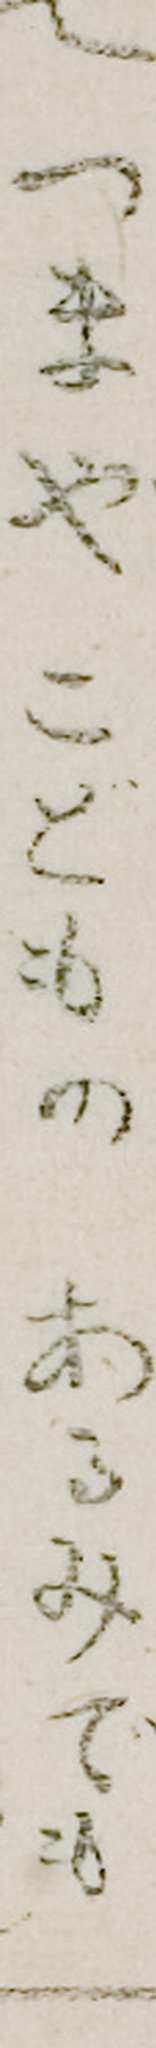七つまやことものあるみでも
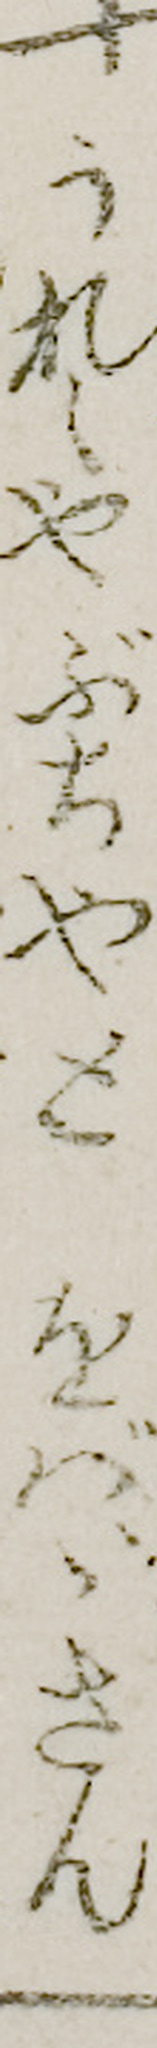二十うれしやぶちやとをバゞさん
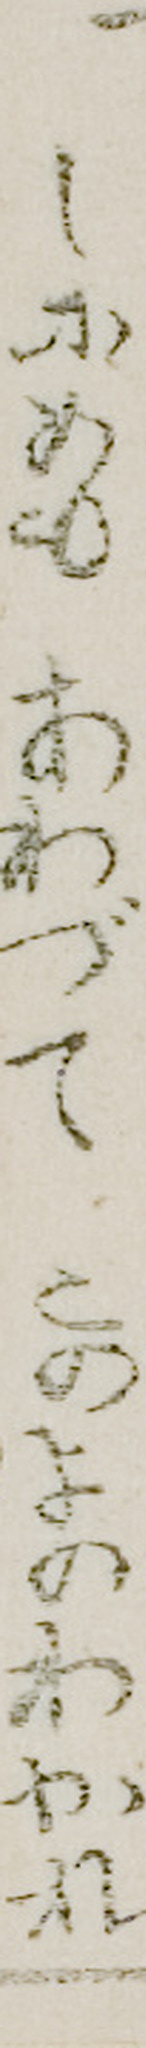しにめもあわずてこのよのわかれ
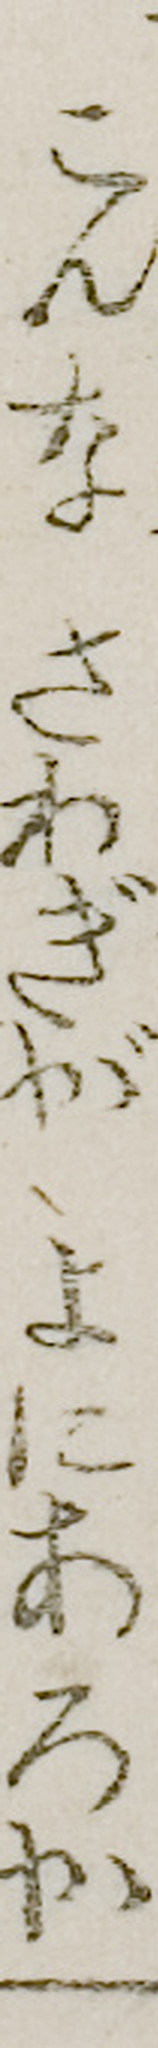こんなさわぎがよにあろか
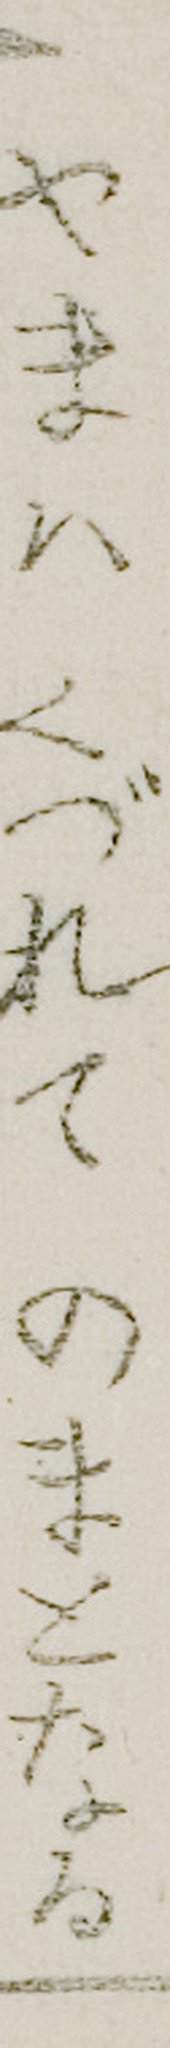やまハくづれてのまとなる
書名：会津ばんだいさん大くづれはなし
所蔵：東京大学総合図書館 General Library in the University of Tokyo, JAPAN
